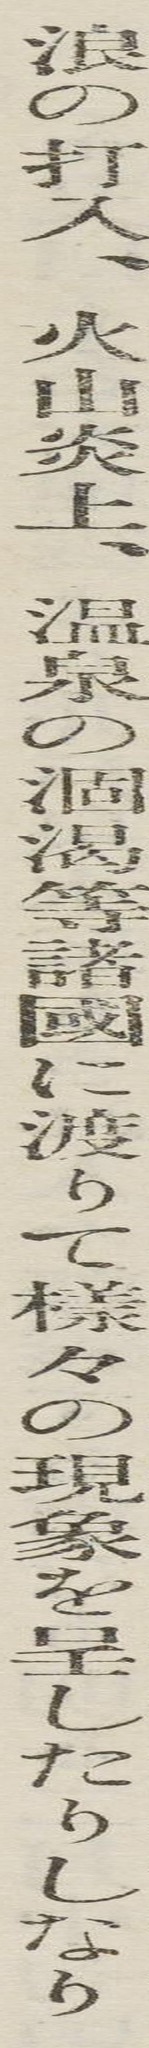浪の打入、火山炎上、温泉の涸渇等諸国に渡りて様々の現象を呈したりしなり
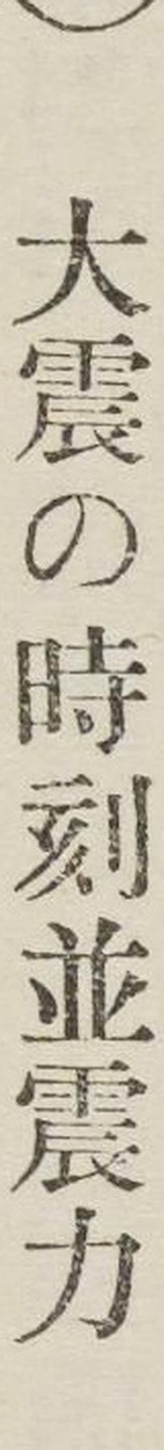大震の時刻並震力
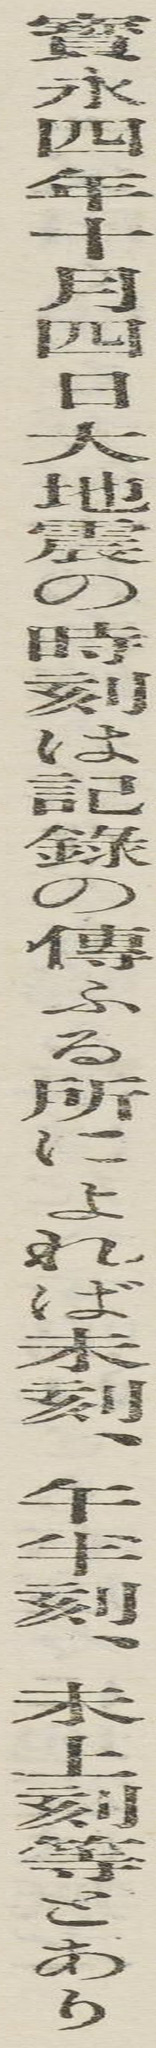宝永四年十月四日大地震の時刻は記録の伝ふる所によれば未刻、午半刻、未上刻等とあり
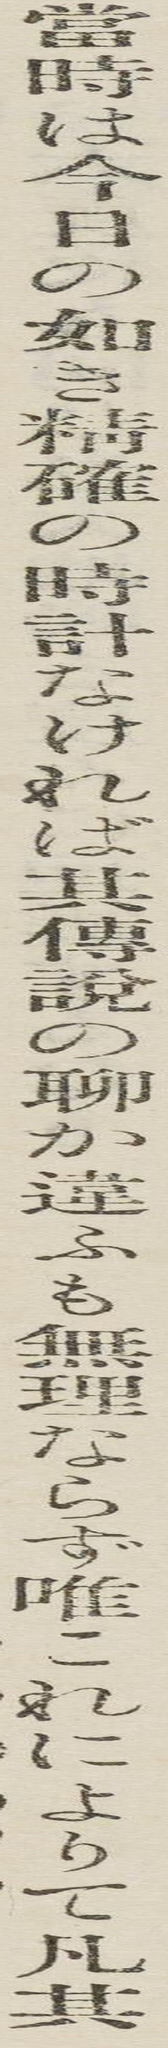当時は今日の如き精確の時計なければ其伝説の聊か違ふも無理ならず唯これによりて凡其
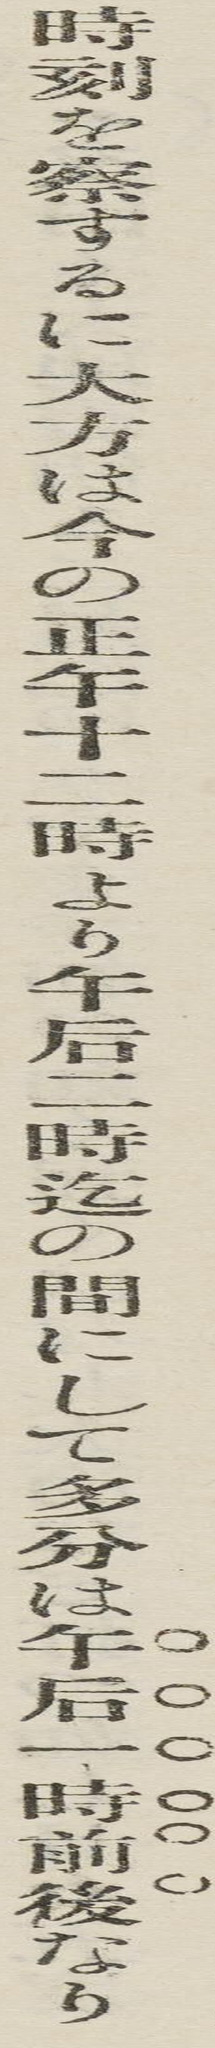時刻を察するに大方は今の正午十二時より午后二時迄の間にして多分は午后一時前後なり
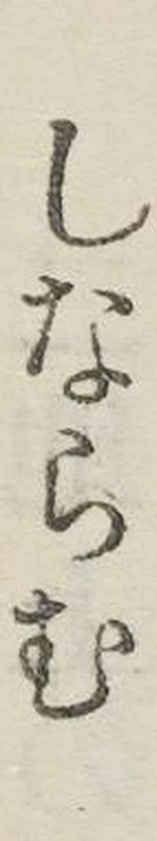しならむ
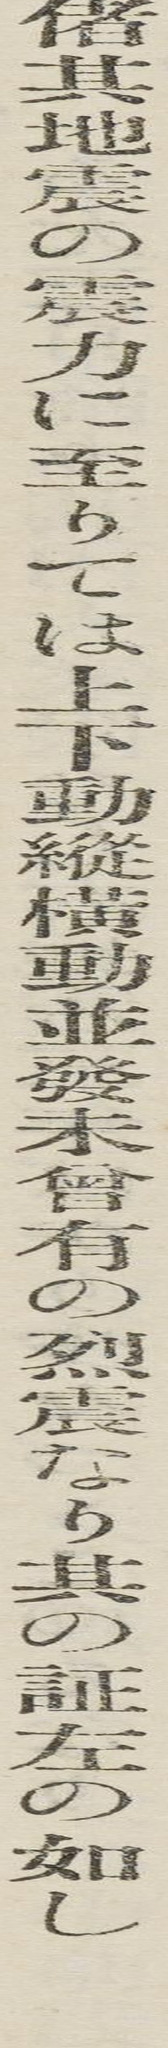偖其地震の震力に至りては上下動縱横動並発未曽有の烈震なり其の証左の如し
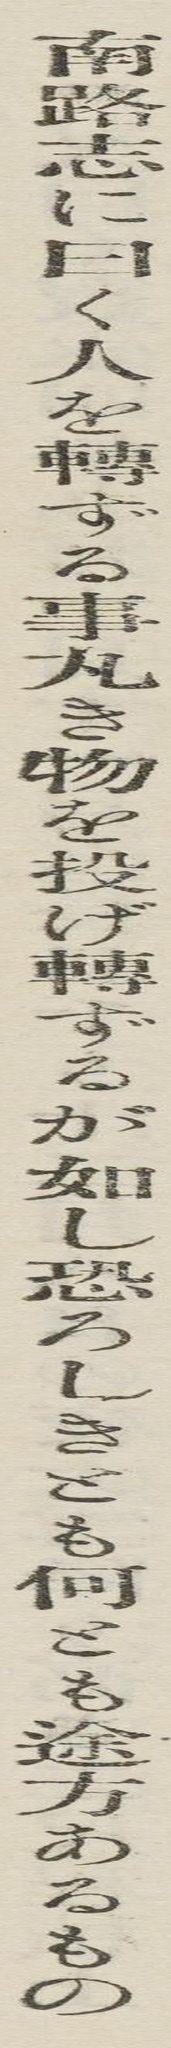南路志に曰く人を転ずる事丸き物を投げ転ずるが如し恐ろしきとも何とも途分あるもの
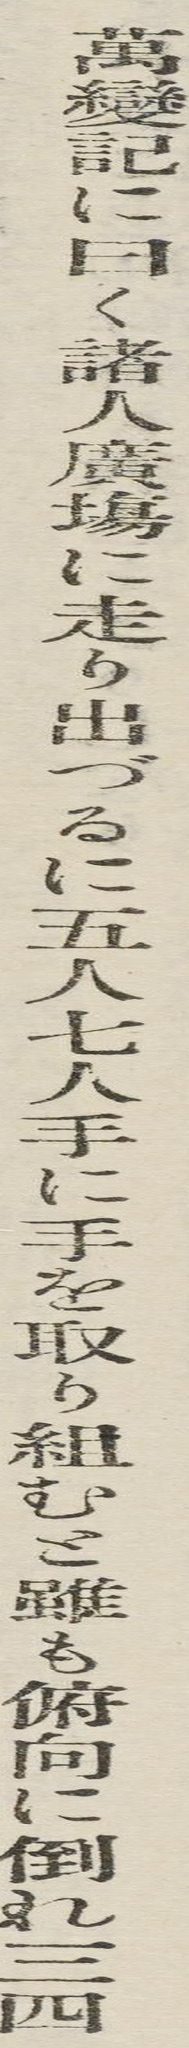万変記に曰く諸人広場に走り出づるに五人七人手に手を取り組むと雖も俯向に倒れ三四
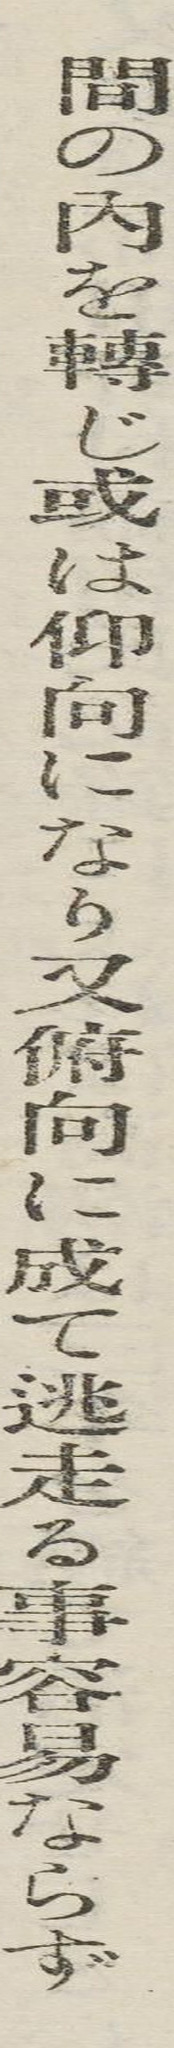間の内を転じ或は仰向になり又俯向に成て逃走る事容易ならず
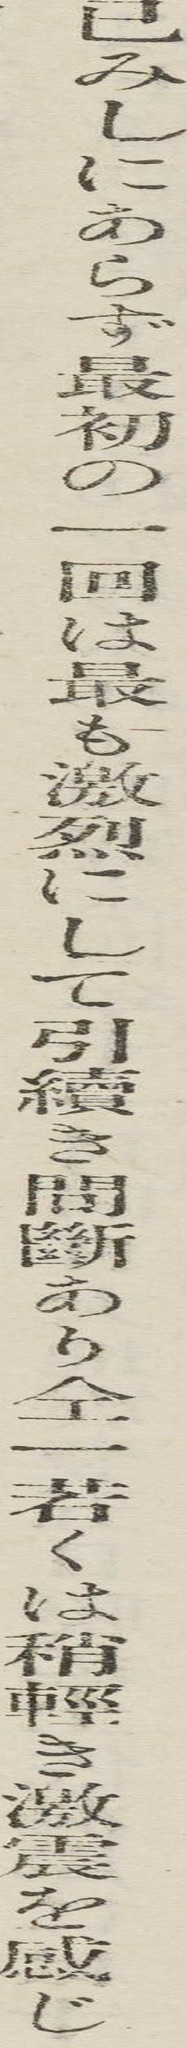已みしにあらず最初の一回は最も激烈にして引続き間断あり同一若くは稍軽き激震を感じ
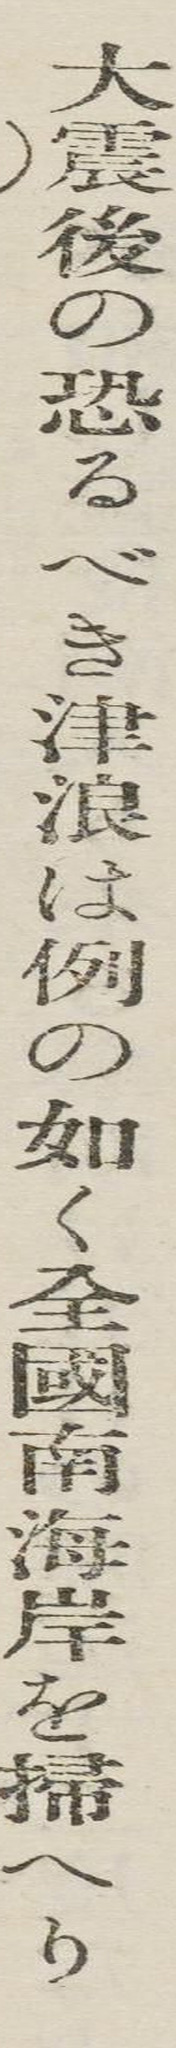大震後の恐るべき津浪は例の如く全国南海岸を掃へり
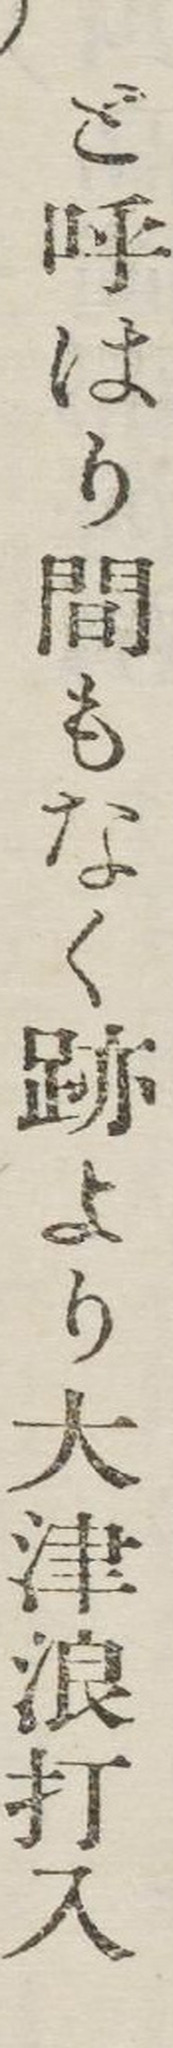と呼はり間もなく跡より大津浪打入
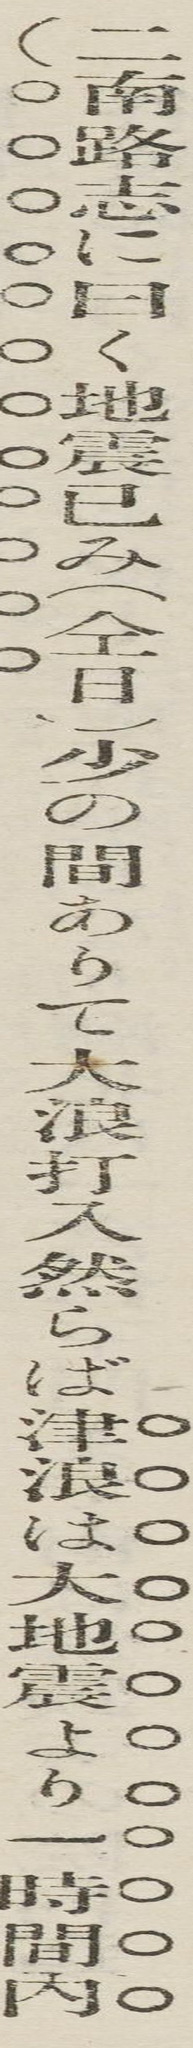南路志に曰く地震已み少の間ありて大浪打入然らば津浪は大地震より一時間内
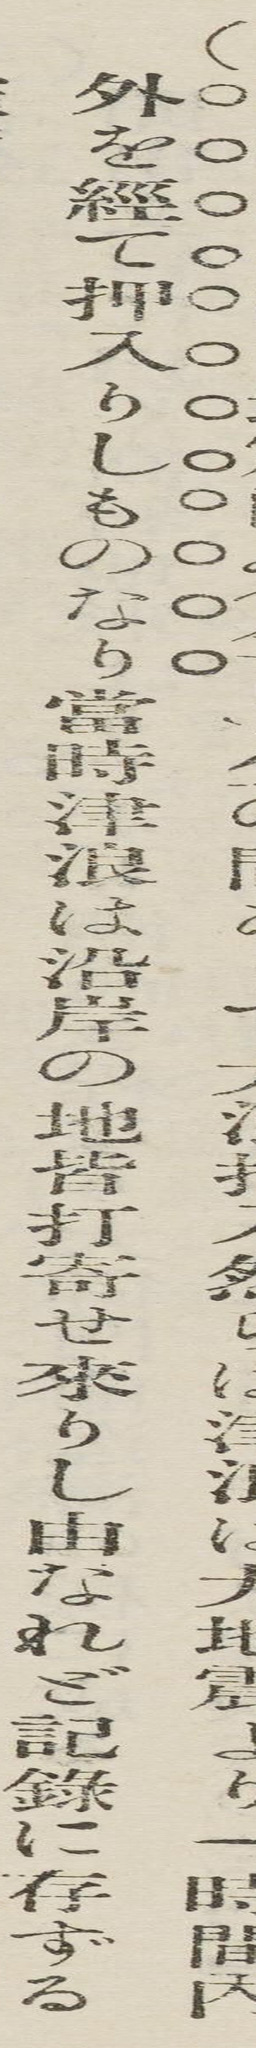外を経て押入りしものなり当時津浪は沿岸の地皆打寄せ來りし由なれど記録に存ずる
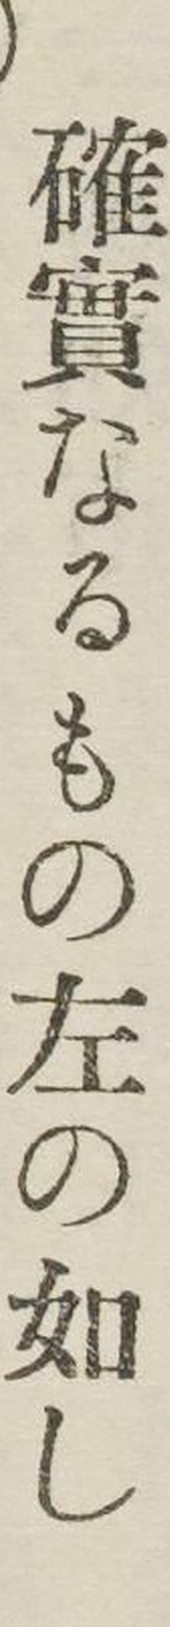確実なるもの左の如し
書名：土佐古今ノ地震
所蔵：東京大学地震研究所図書室 Earthquake Research Institute Library, The University of Tokyo, JAPAN
